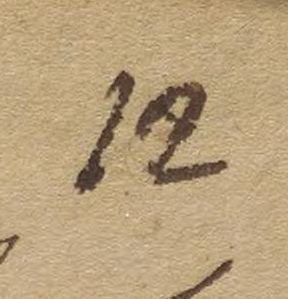12
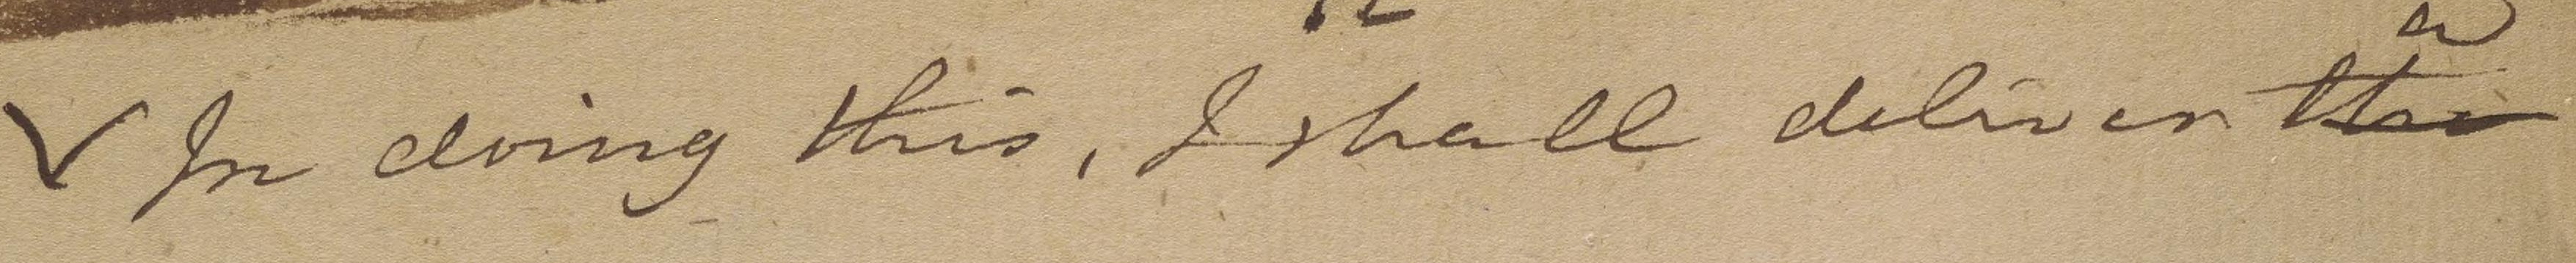V In doing this, I shall deliver [the] ^a
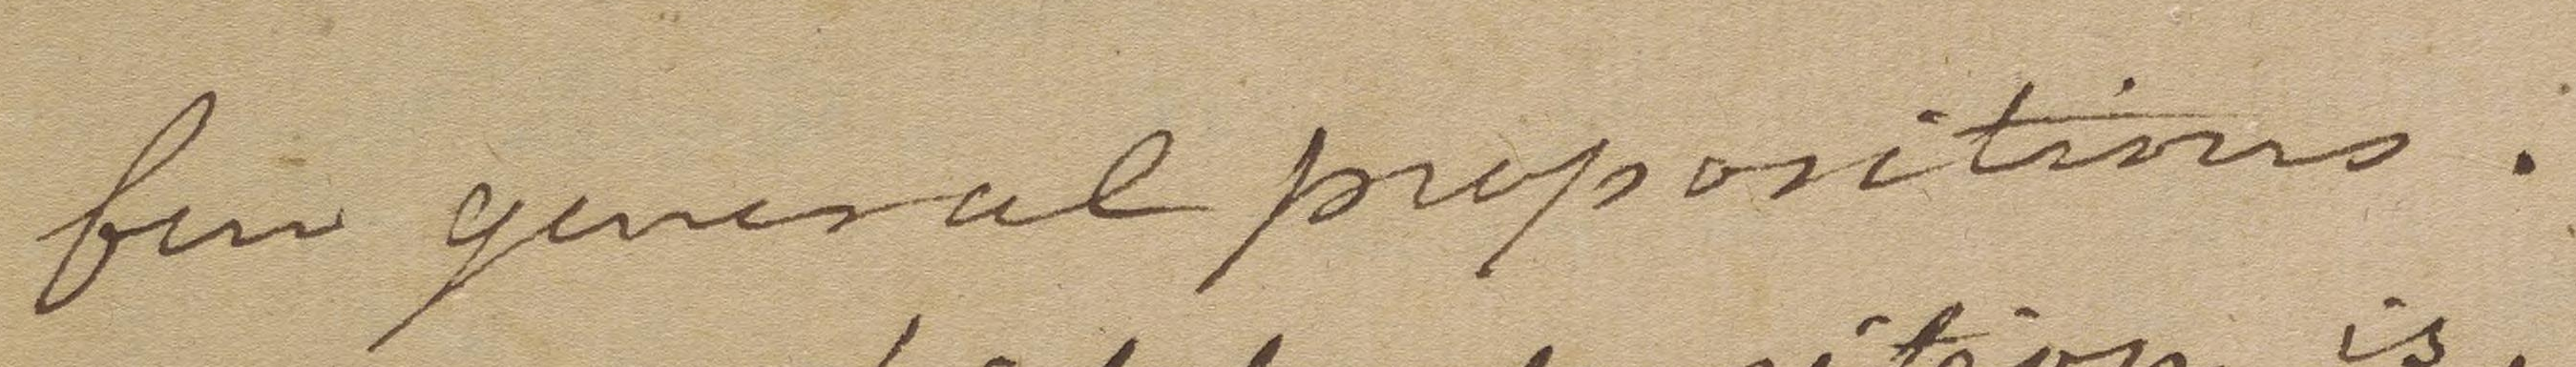few general propositions.
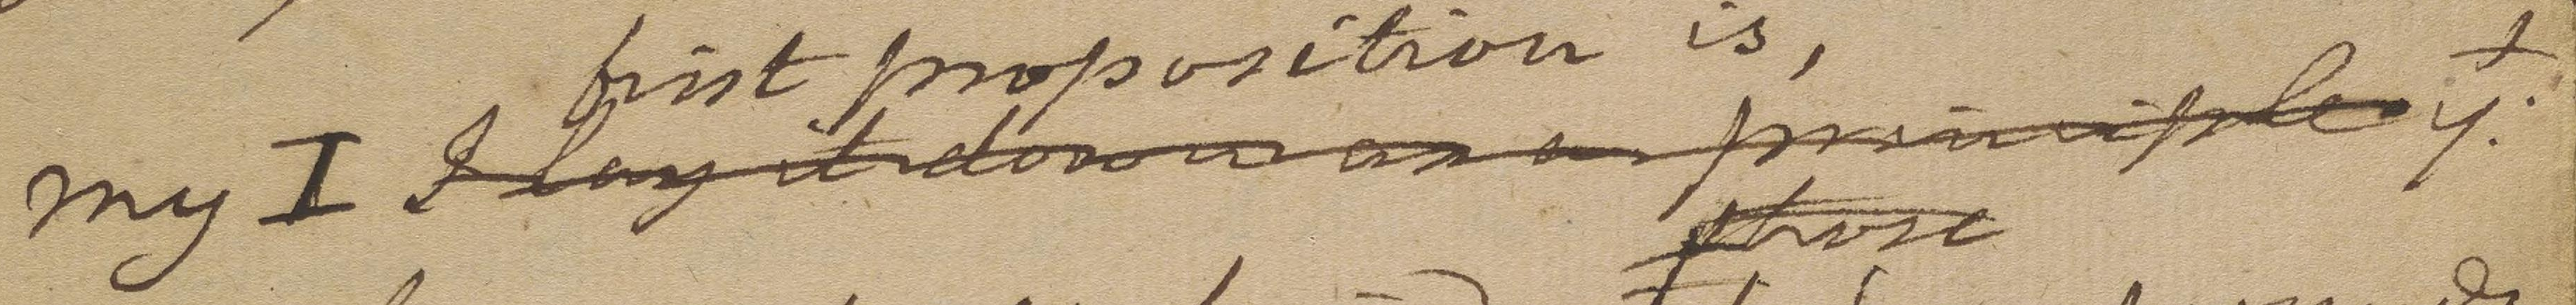My I [I lay it down as a principle] y^t
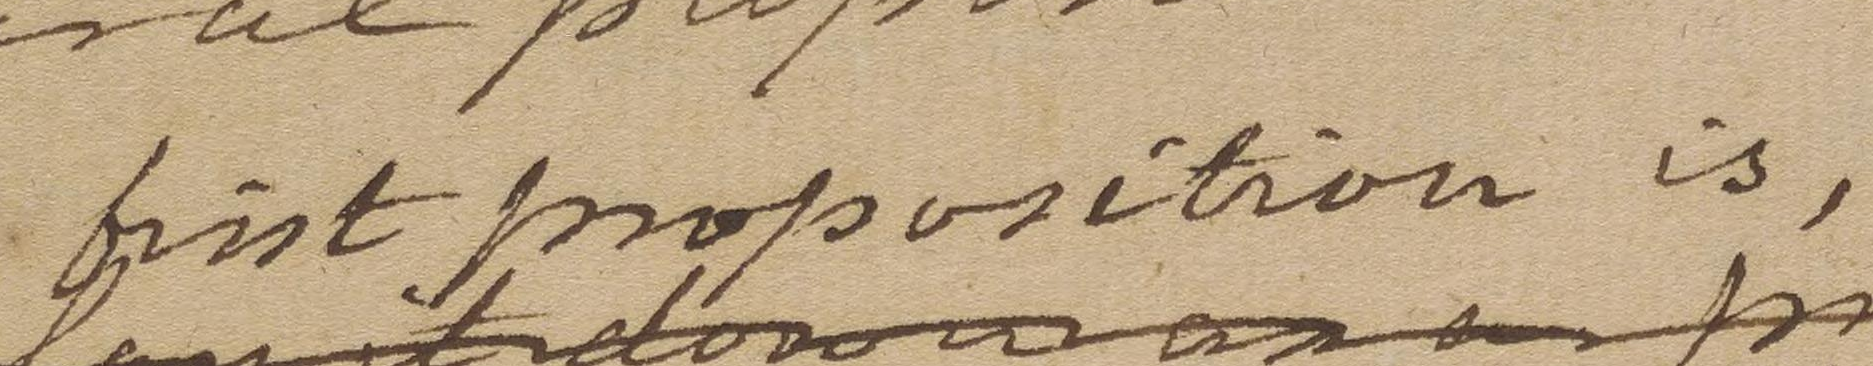first proposition is,
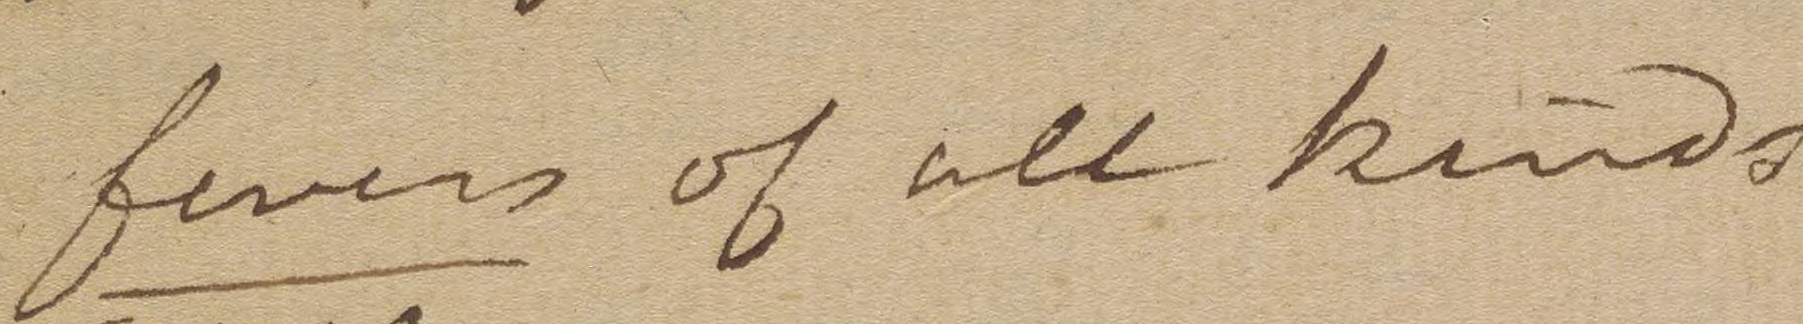fevers of all kinds
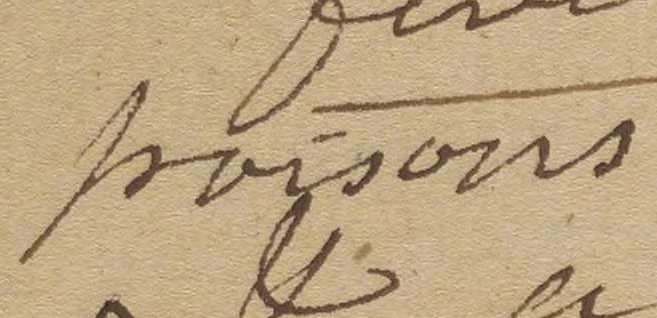poisons
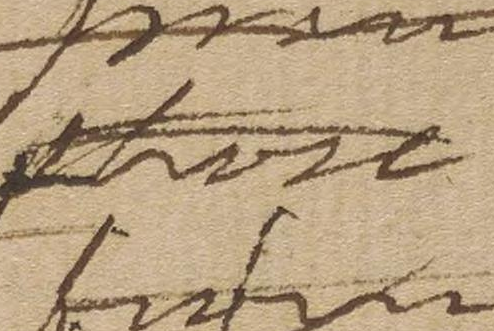those
